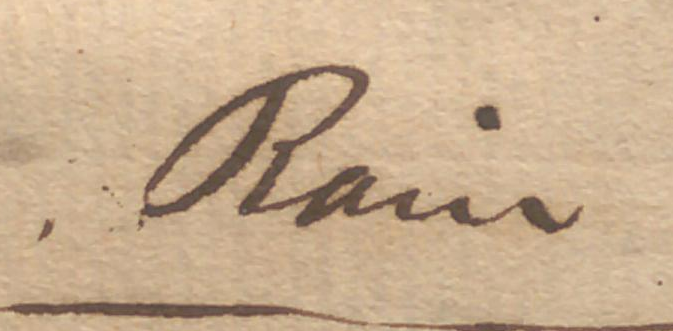Rain
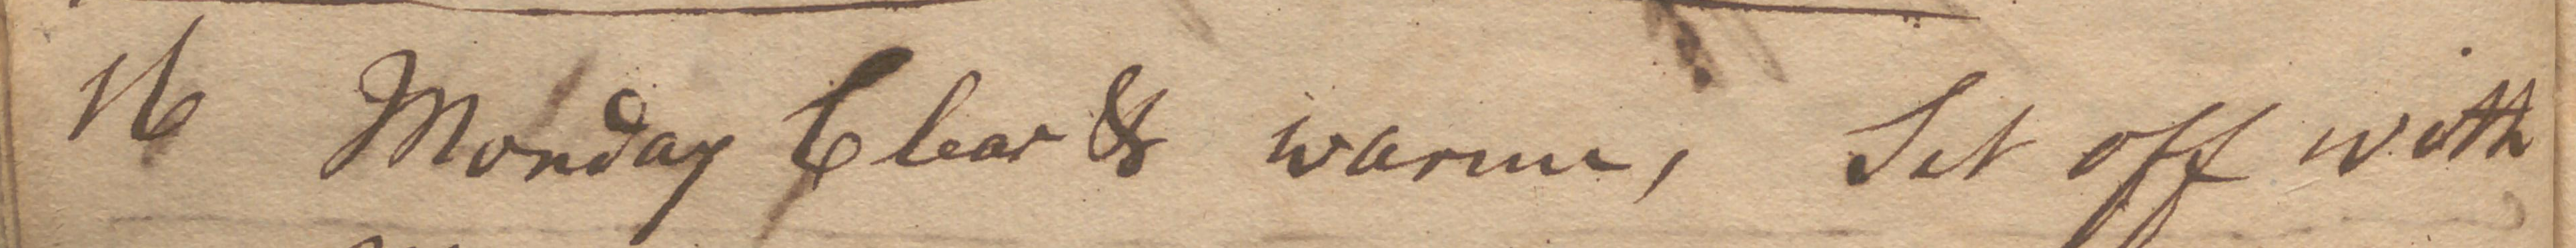16 Monday Clear & warme, Set off with
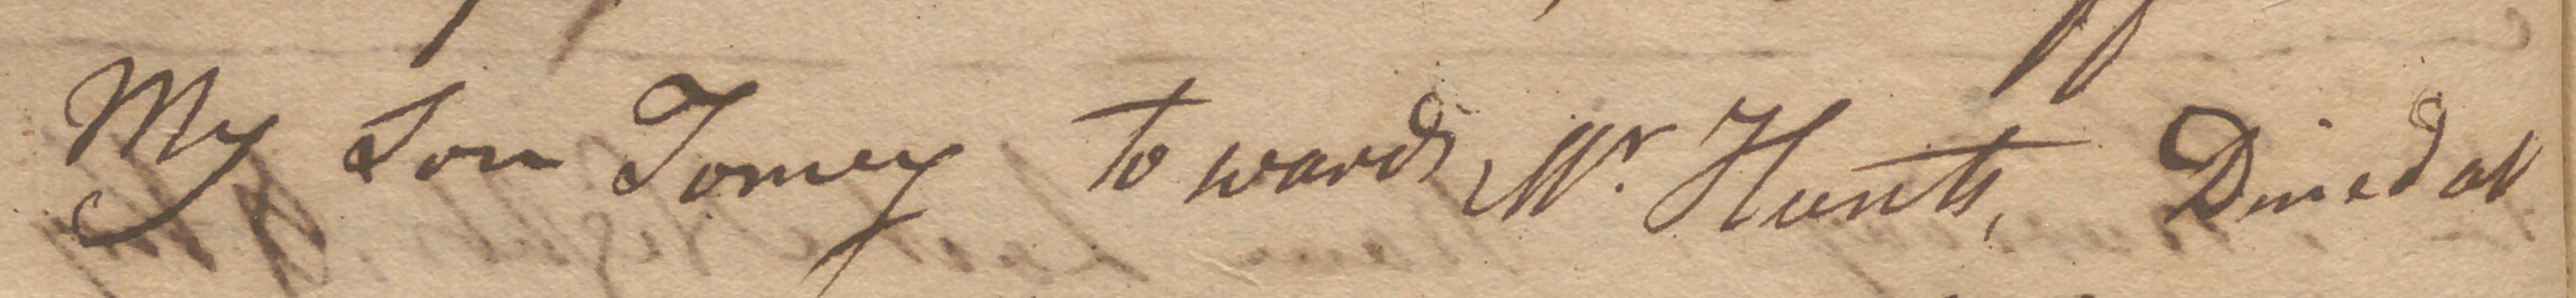My Son Tomey to wards M^r. Hunts Dined at
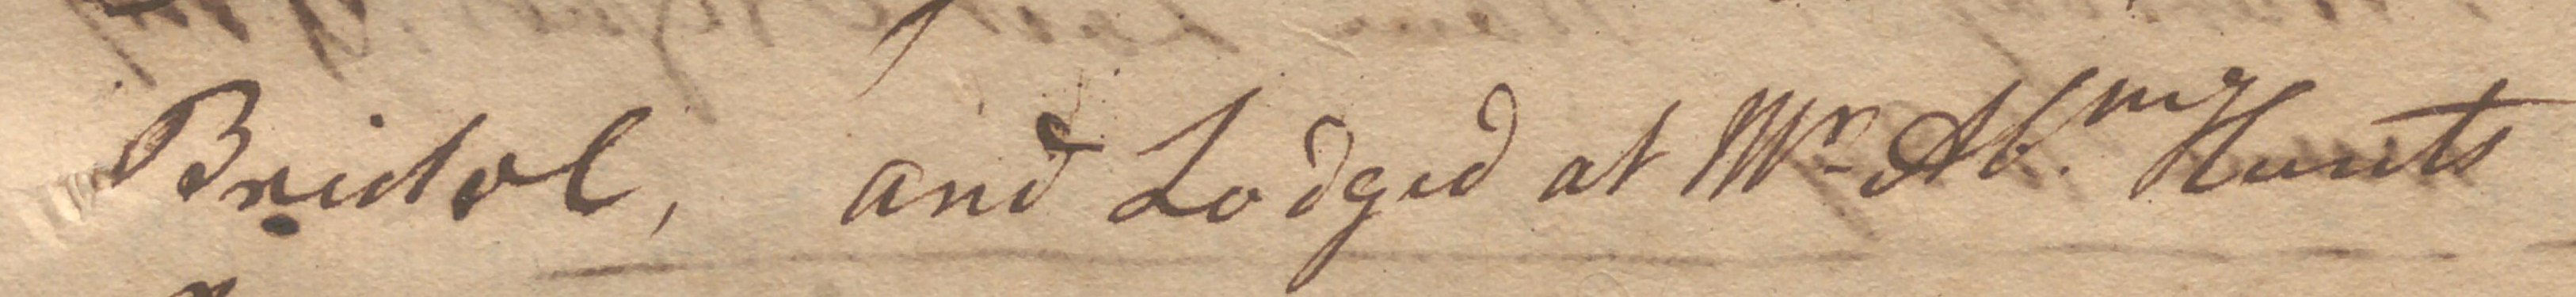Bristol, and Lodged at M^r. Ab^m. Hunts
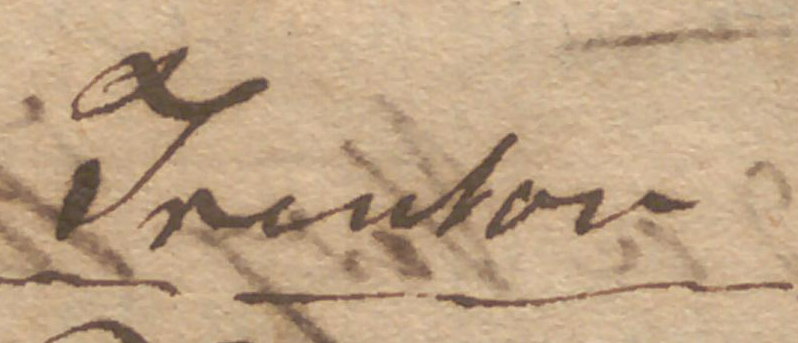Trenton
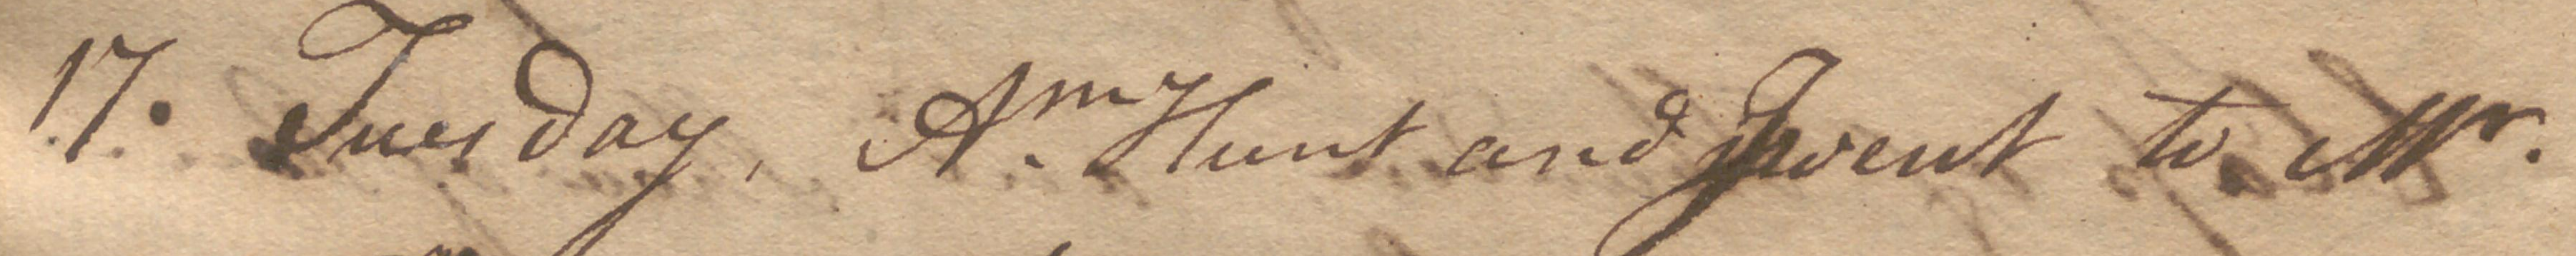17. Tuesday, A^m. Hunt and I went to M^r.
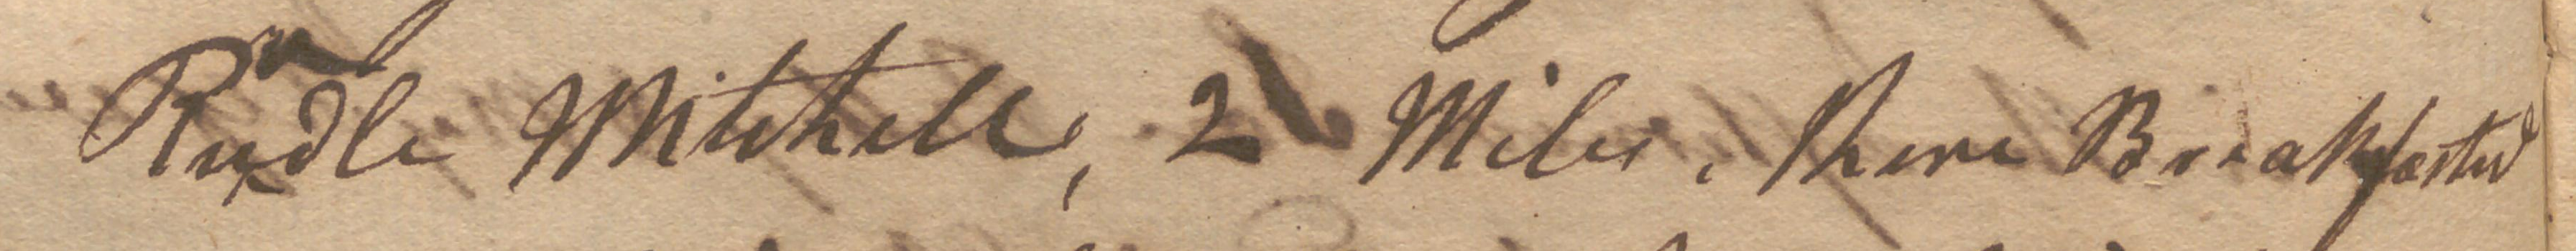Ra^ndle Mitchell, 2 Miles there Brighton
